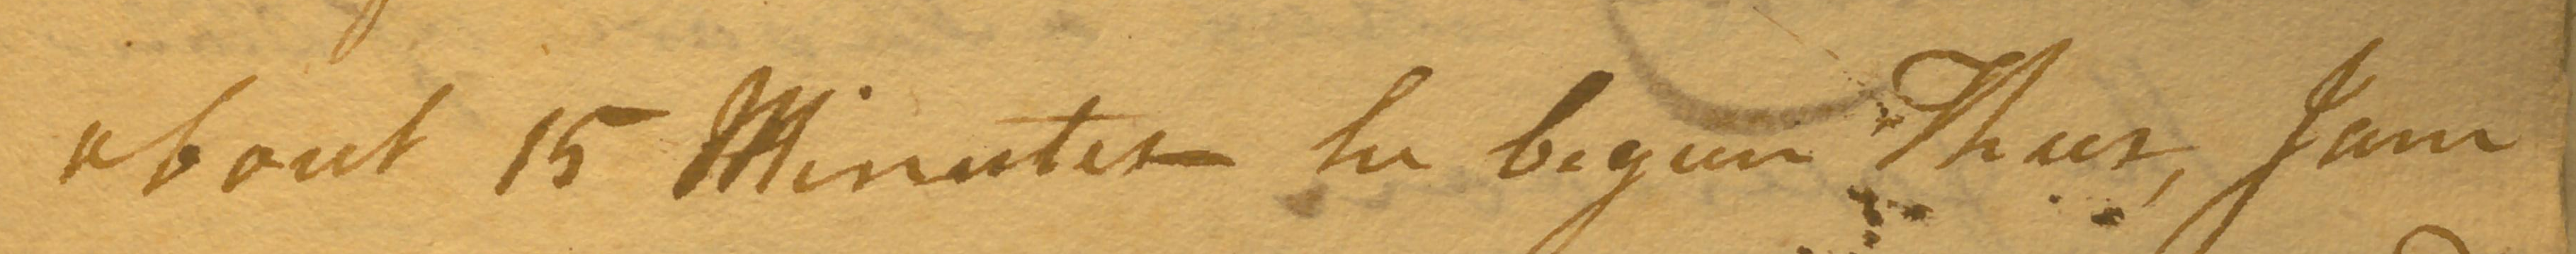about 15 Minutes he begun Thus Iam
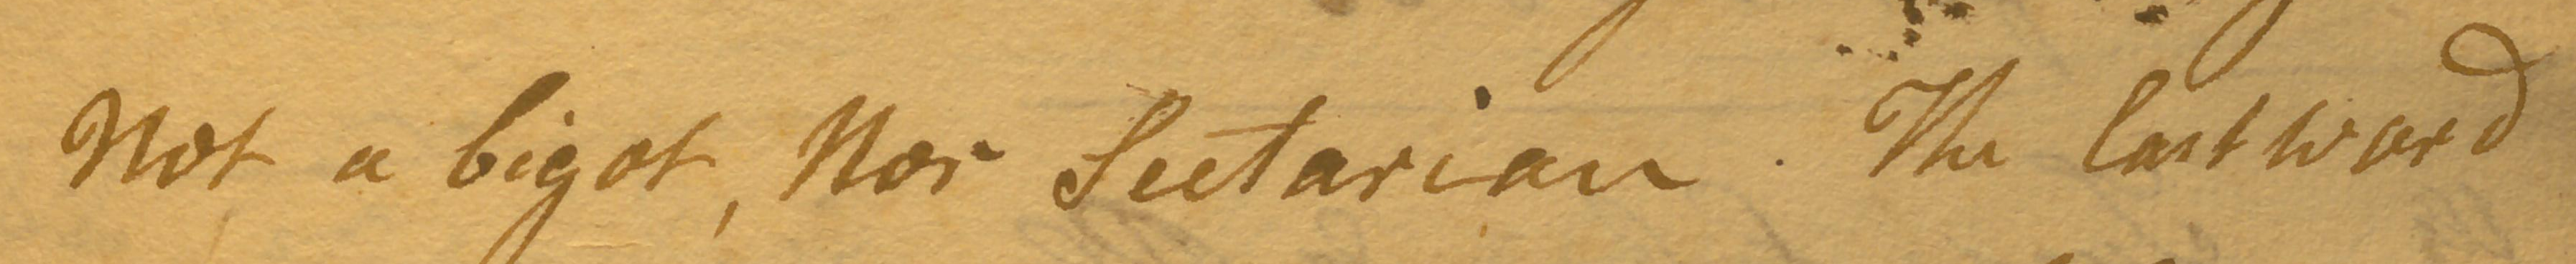Not a bigot Nor Sectarian. The last ward
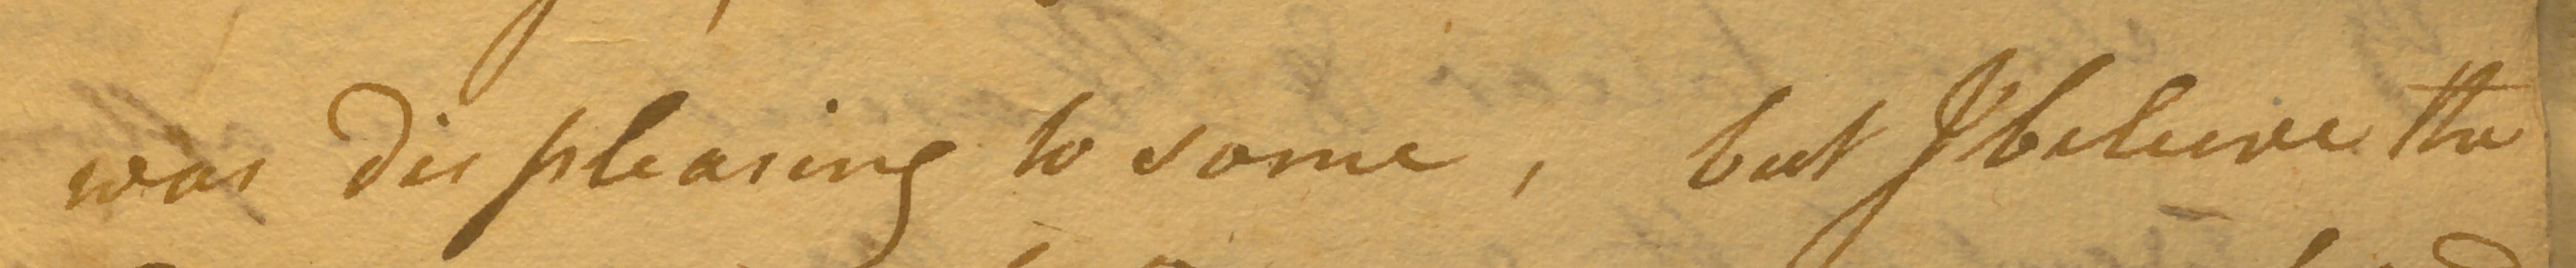was displeasing to some, but I believe the
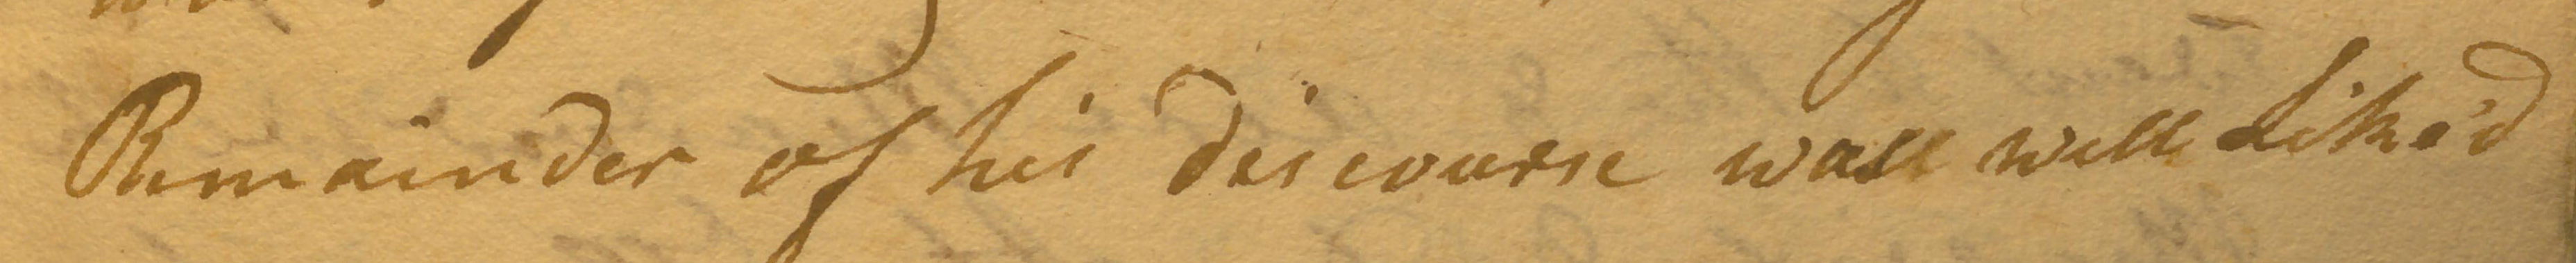Remainder of his discourse was will Like'd
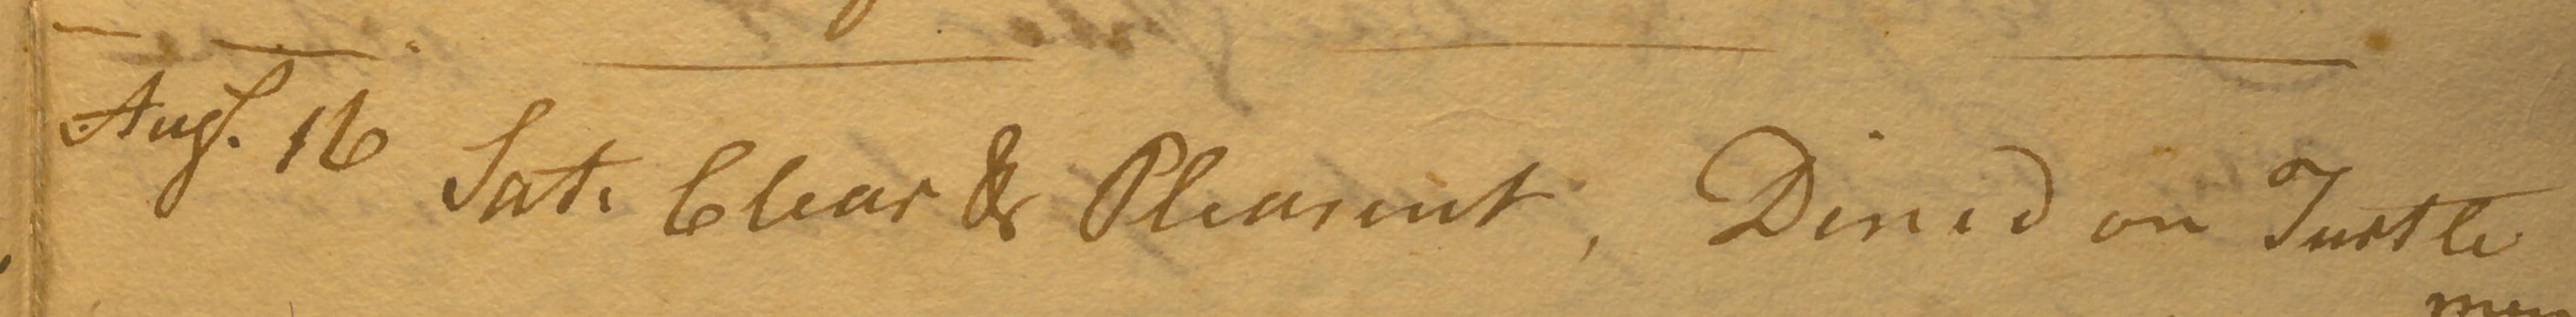Aug^t. 16 Sat. Clear & Pleasent, Dined on Turtle
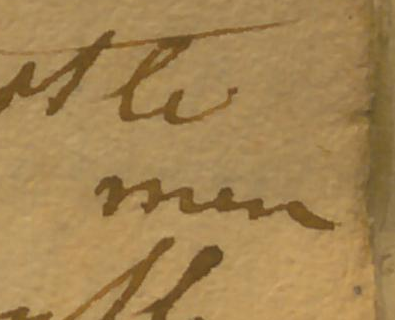men
